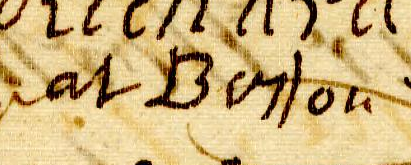at Boston
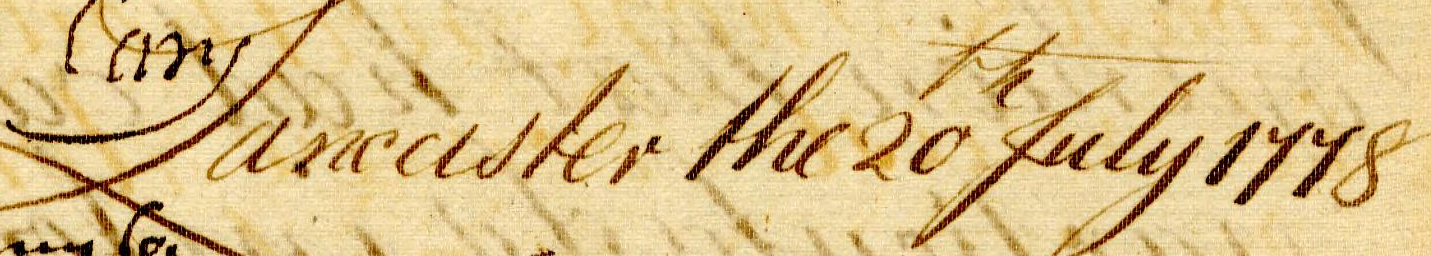Lancaster the 20^th July 1778
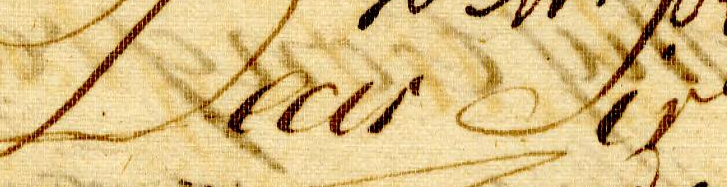Dear Sir
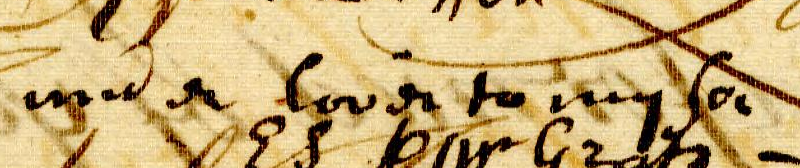under Cover to my Son
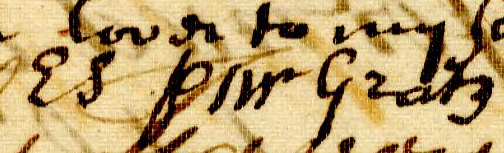ES Per Gratz -
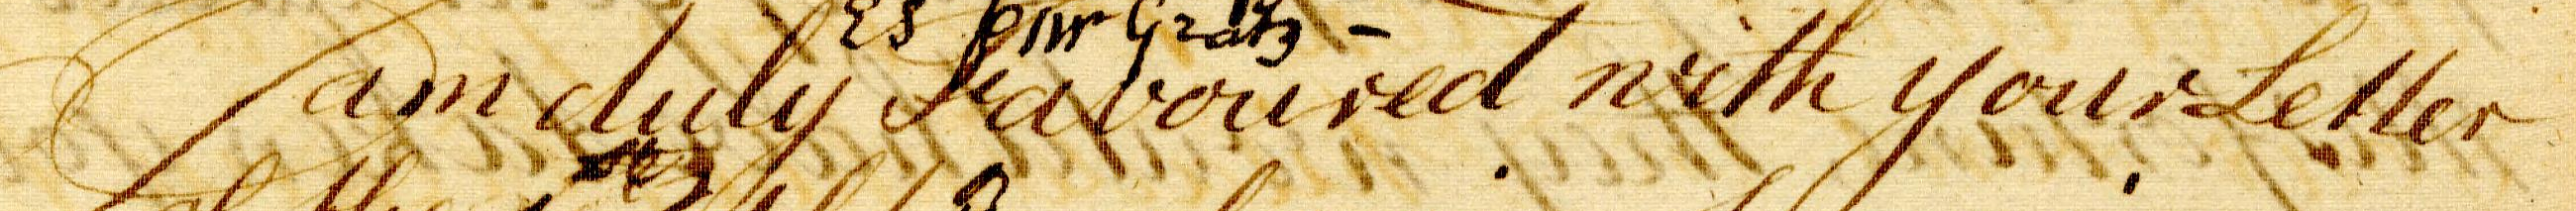I am duly favoured with Your Letter
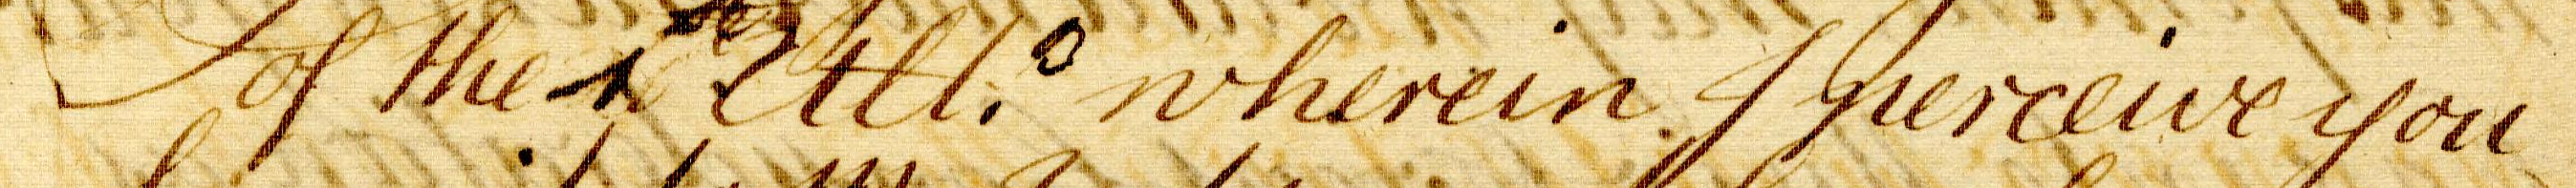of the ^ Ult^o. wherein I perceive You
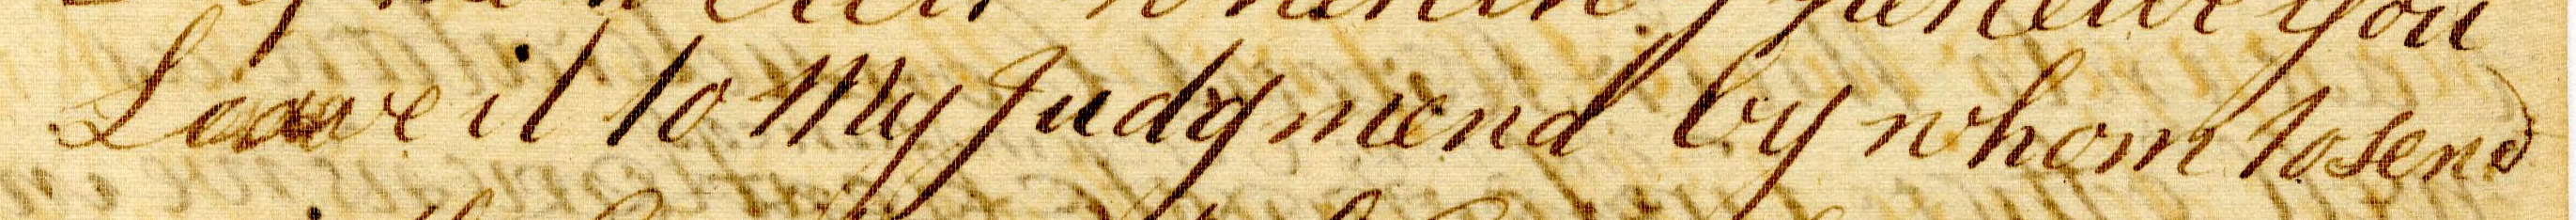Leave it to My Judgment by whom to send
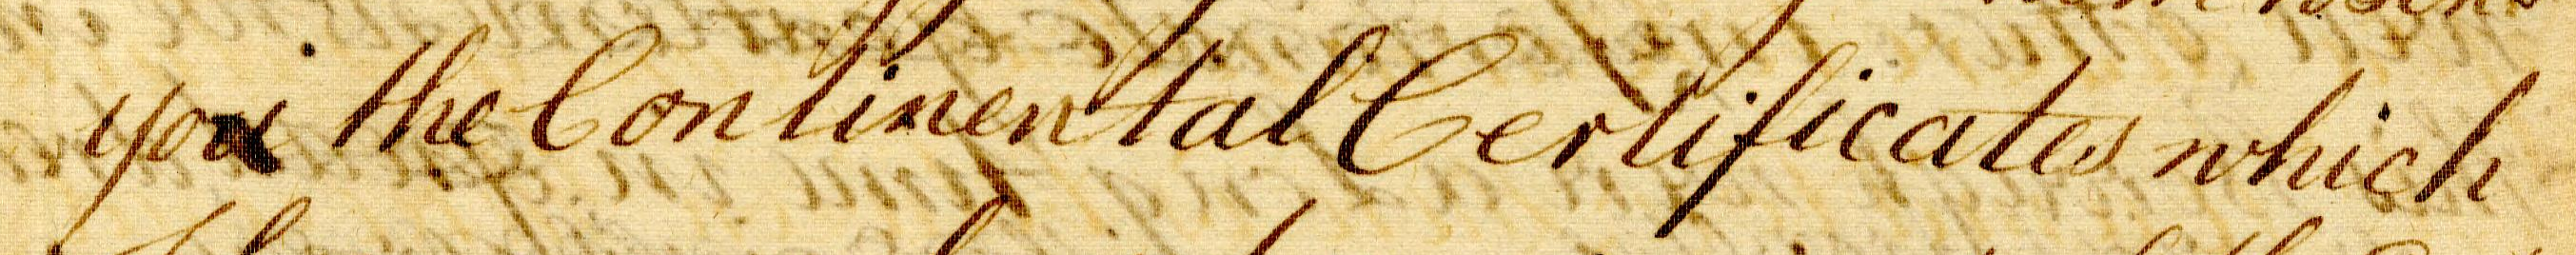You the Continental Certificates which
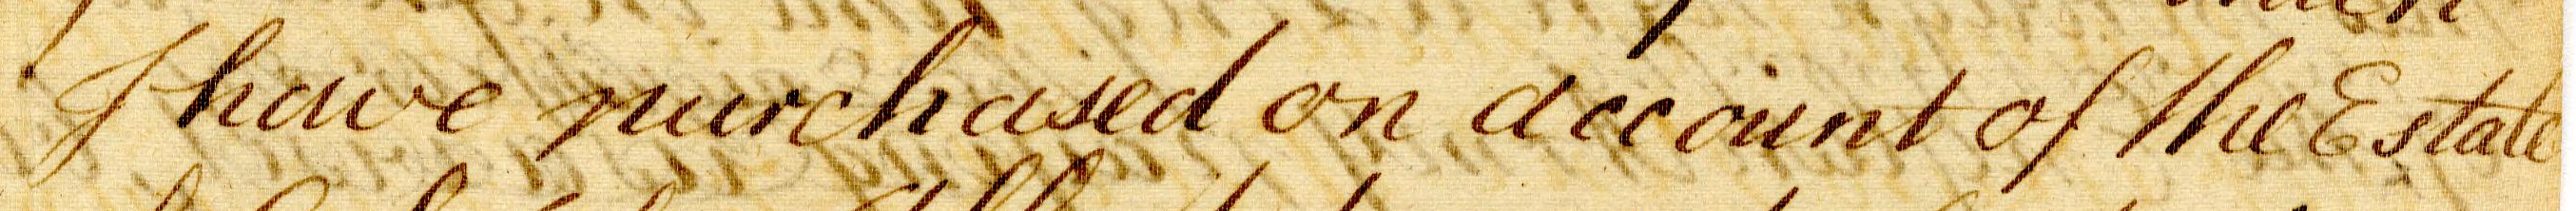I have purchased on account of the Estate
